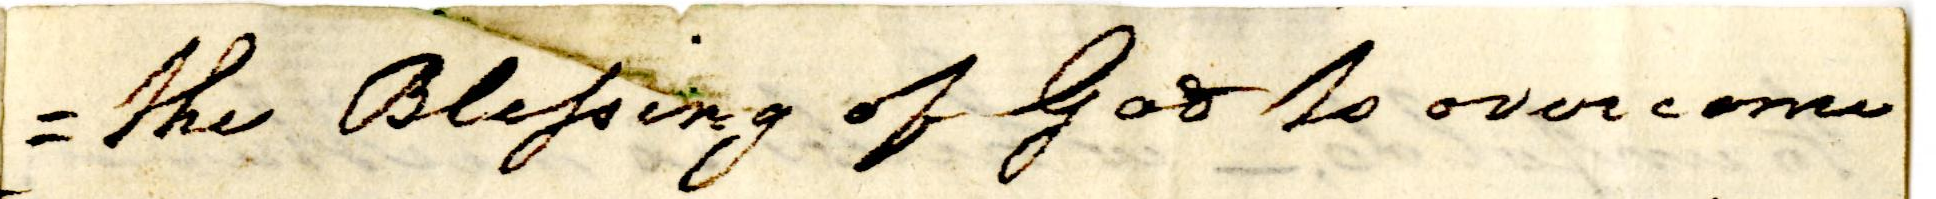-the Blessing of God to overcome
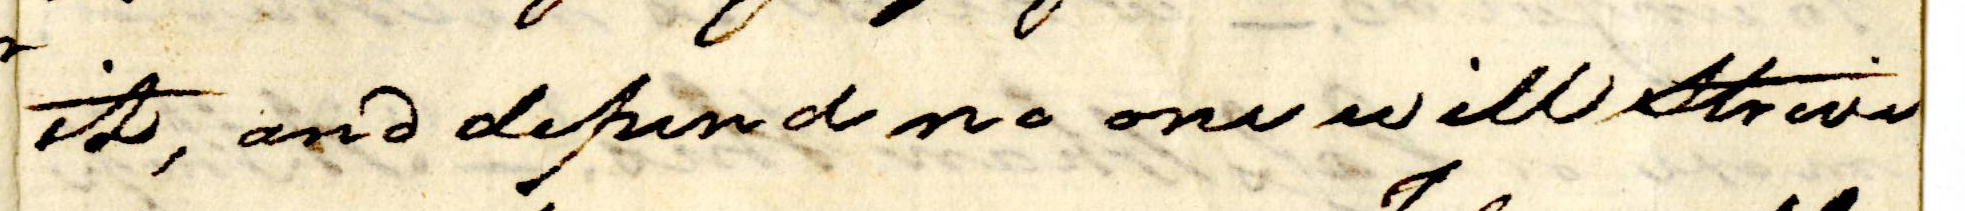it, and depend no one will strive
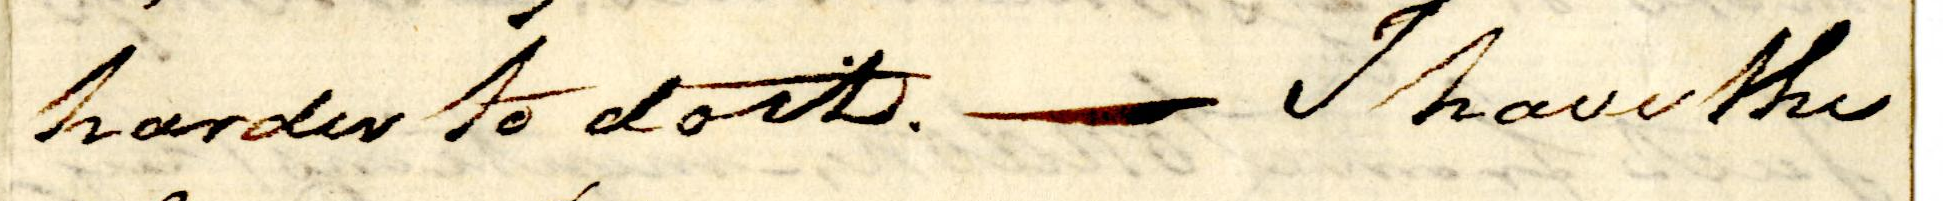harder to do it.- I have the
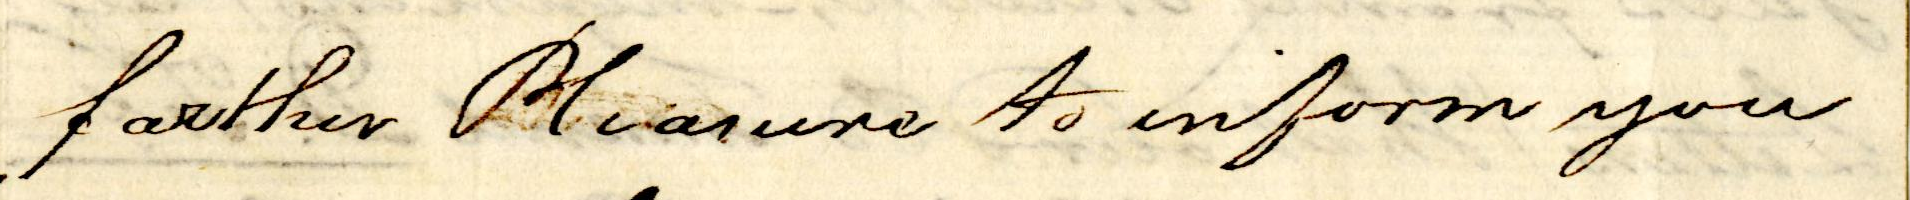farther Pleasure to inform you
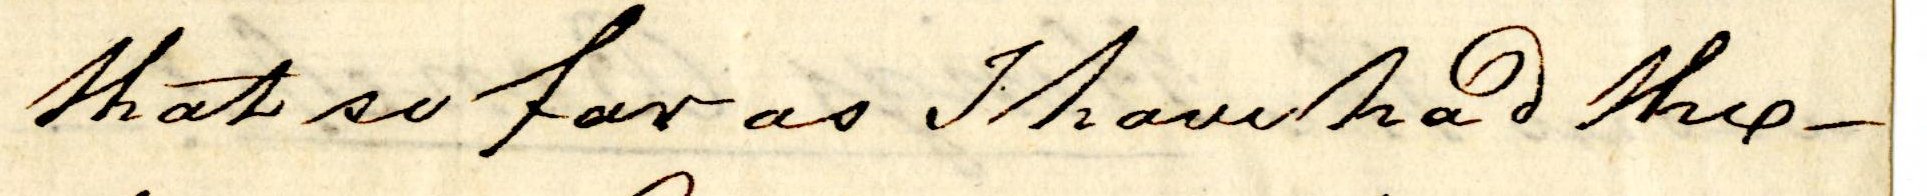that so far as I have had the-
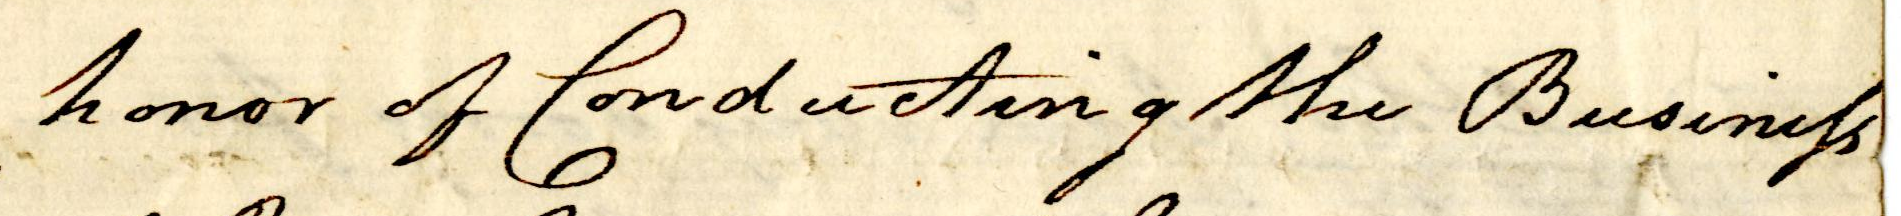honor of Conducting the Business
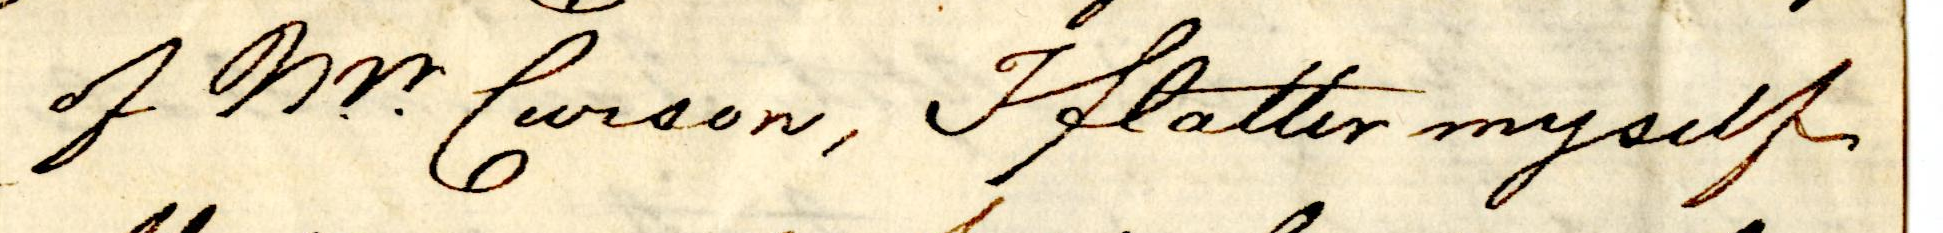of M^r. Carson, I flatter myself
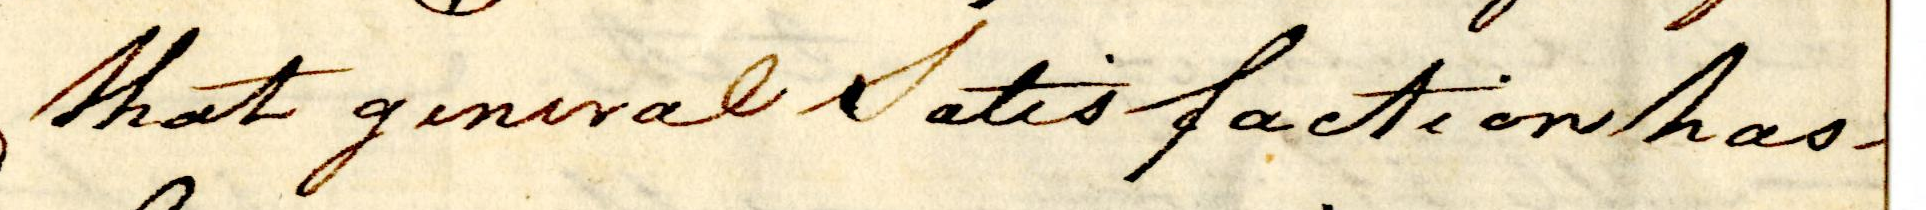that general satisfaction has
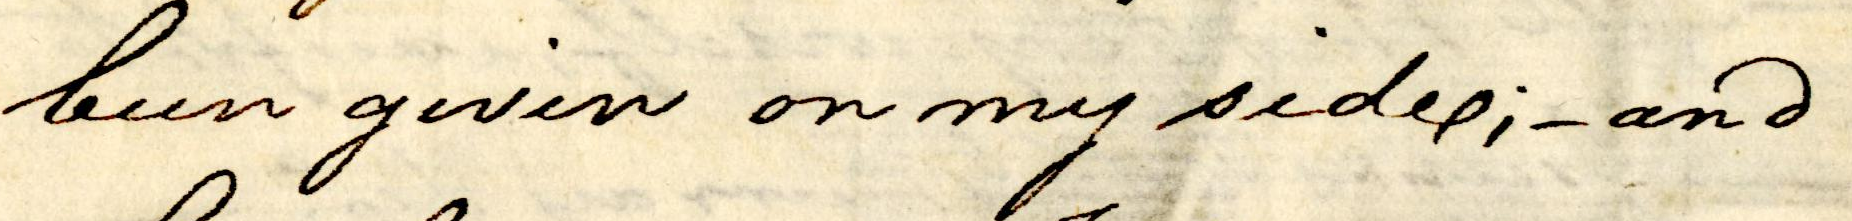been given on my side;- and
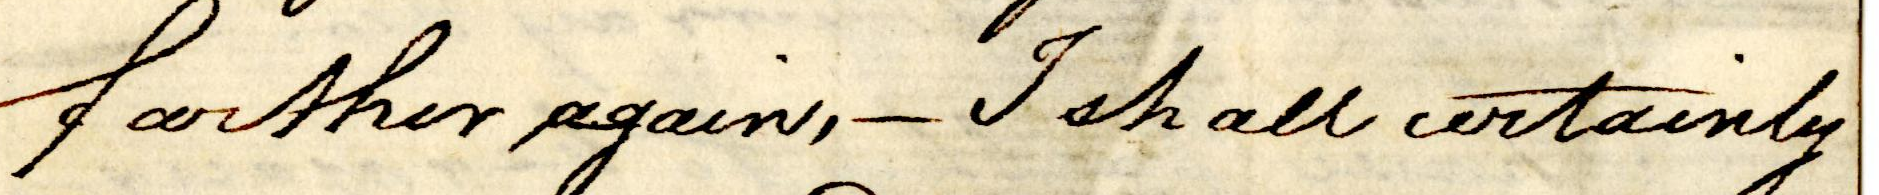farther again,- I shall certainty
